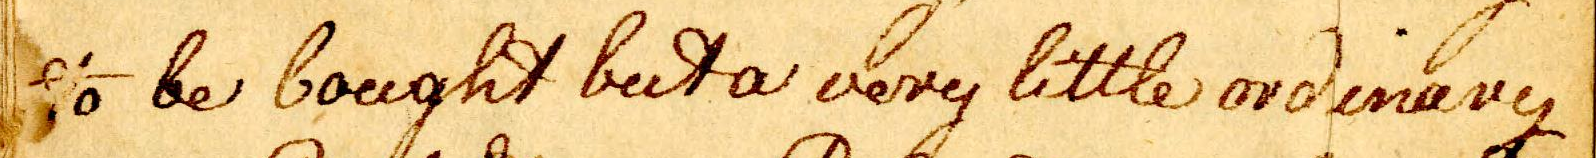to be bought but a very little ordinary
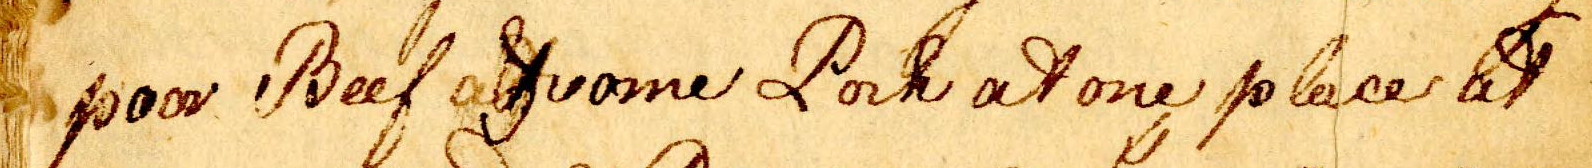poor Beef & some Pork at one place at
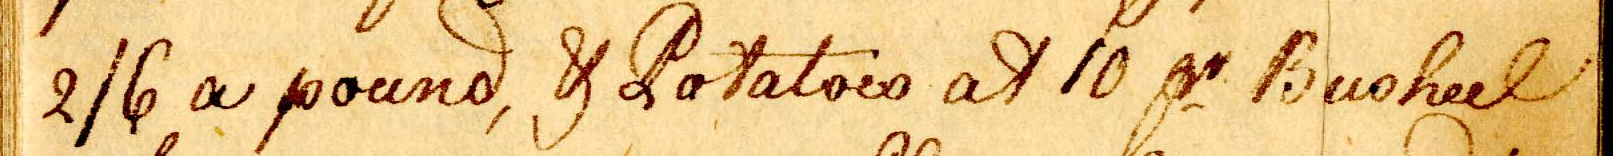2s6 a pound, & Potatoes at 10 per Busheel
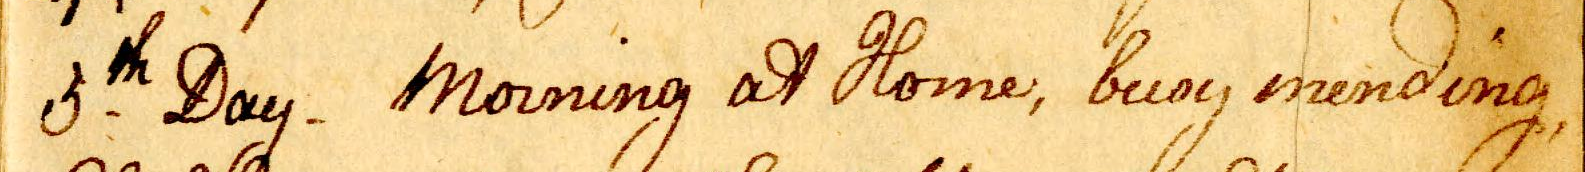5^th Day- Morning at Home, busy mending,
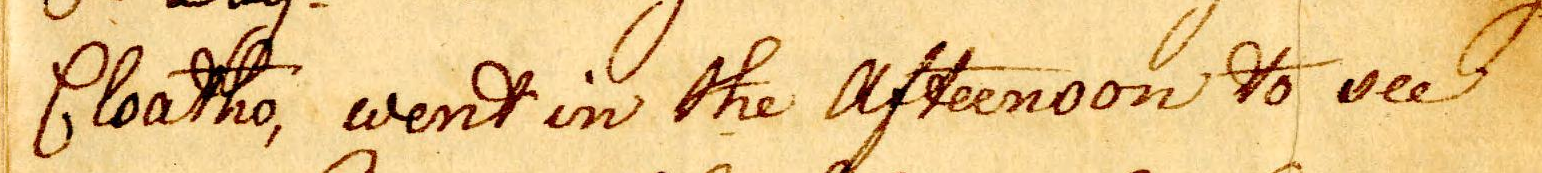Cloaths, went in the Afternoon to see
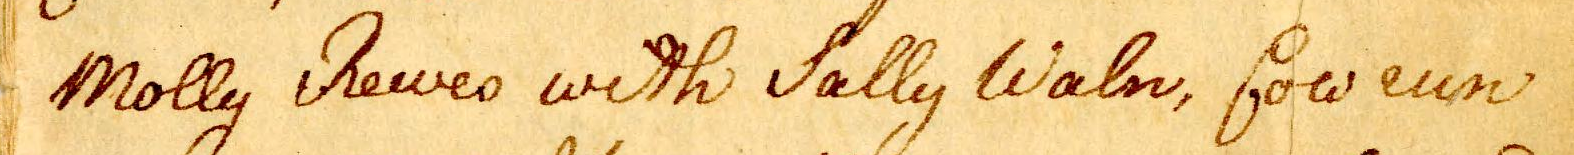Molly Reeves with Sally Waln, Cow run
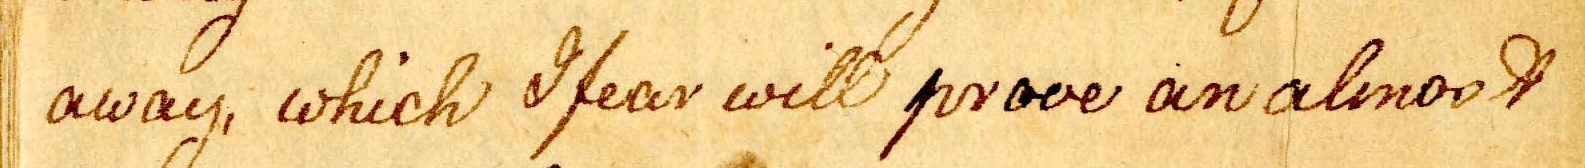away, which I fear will prove an almost
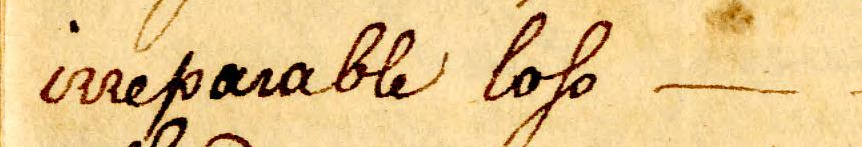irreparable loss-
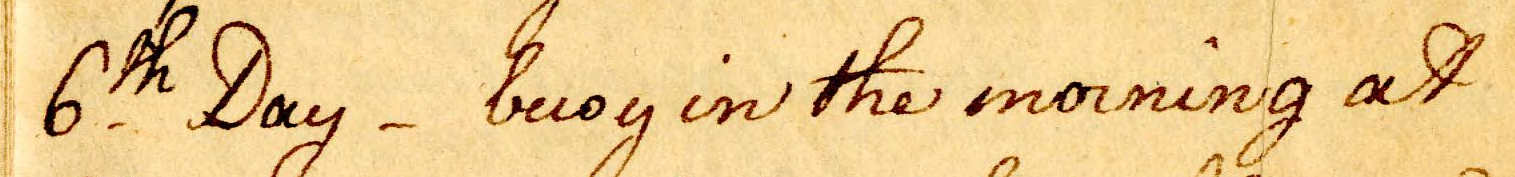6^th Day- busy in the morning at
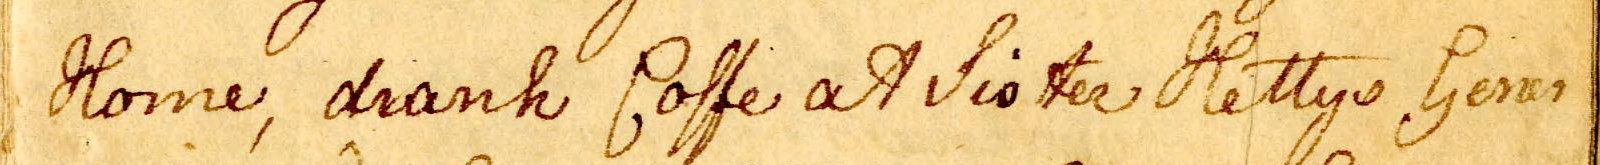Home, drank Coffe at Sister Hettys Gener
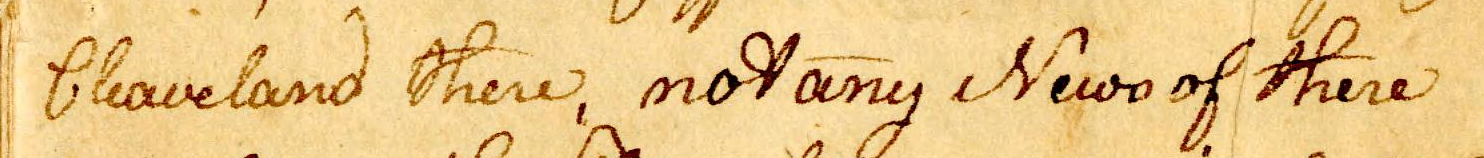Cleaveland there, not any News of there
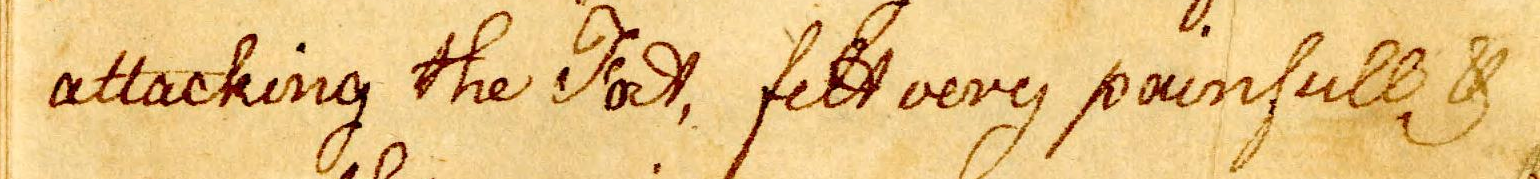attaching the Fort, felt very painfull &
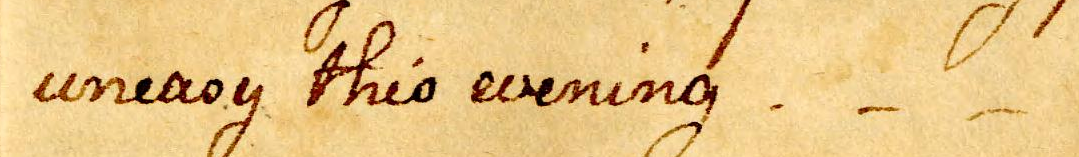uneasy this evening---
